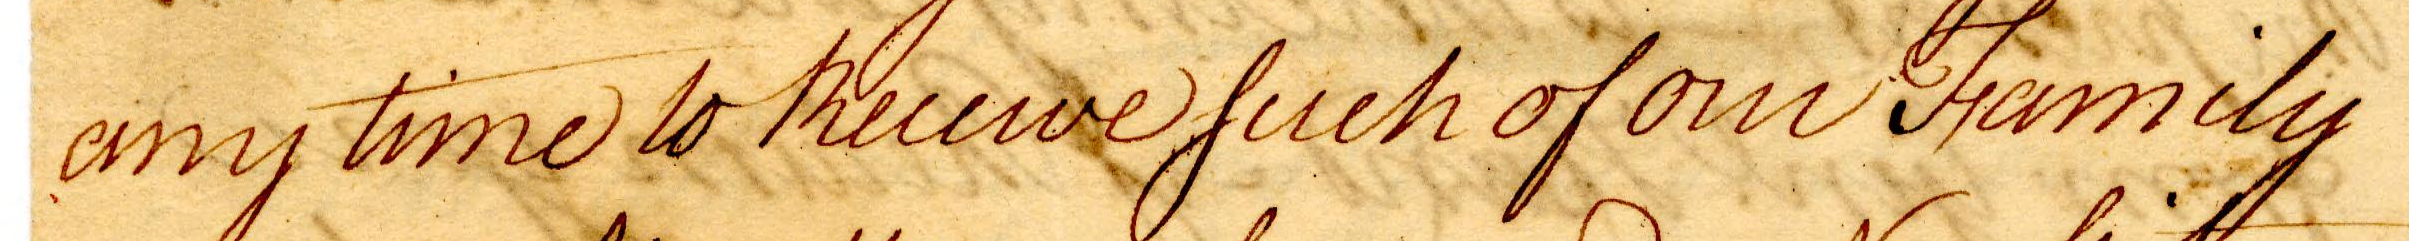any time to Receive such of our Family
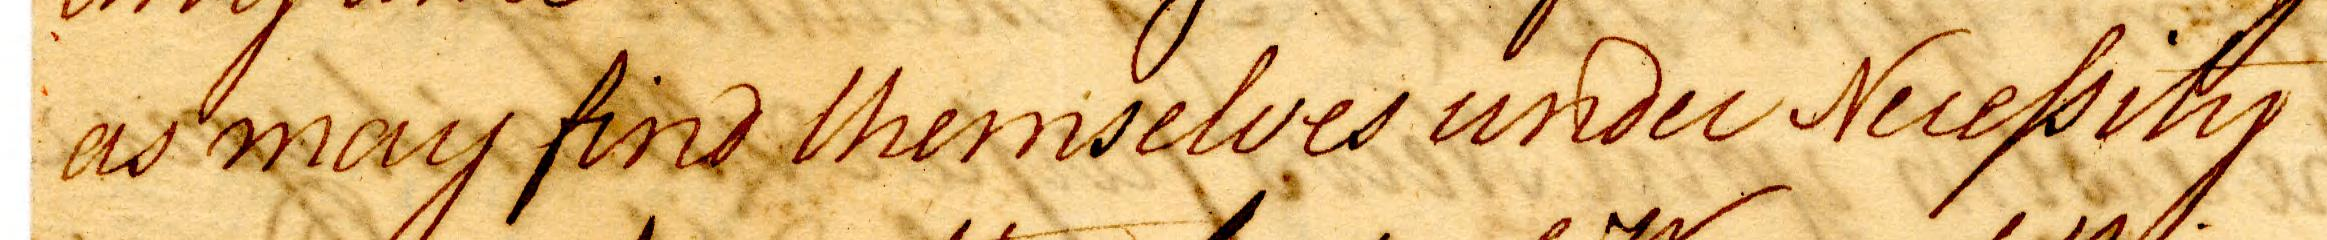as may find themselves under Necessity
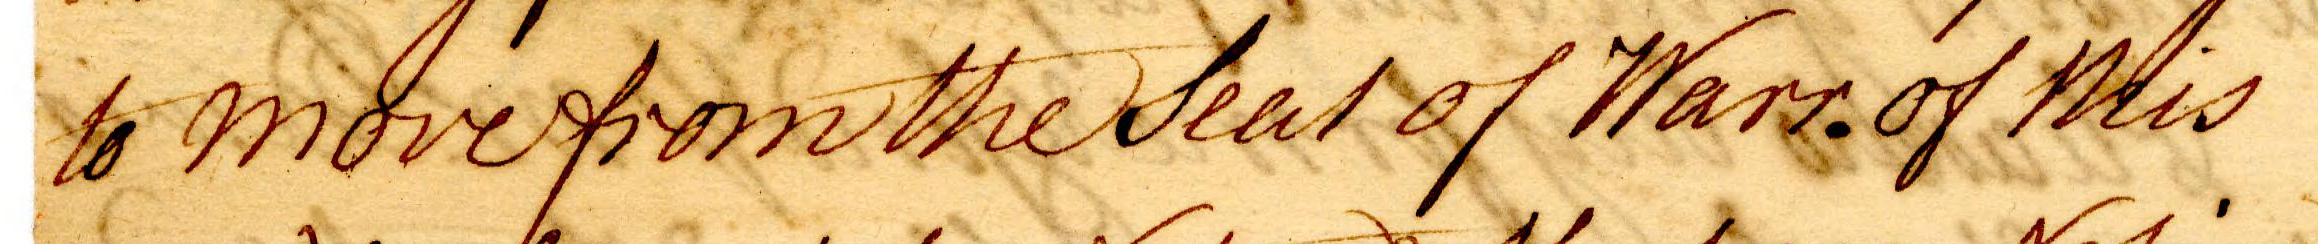to move from the Seat of Warr. of this
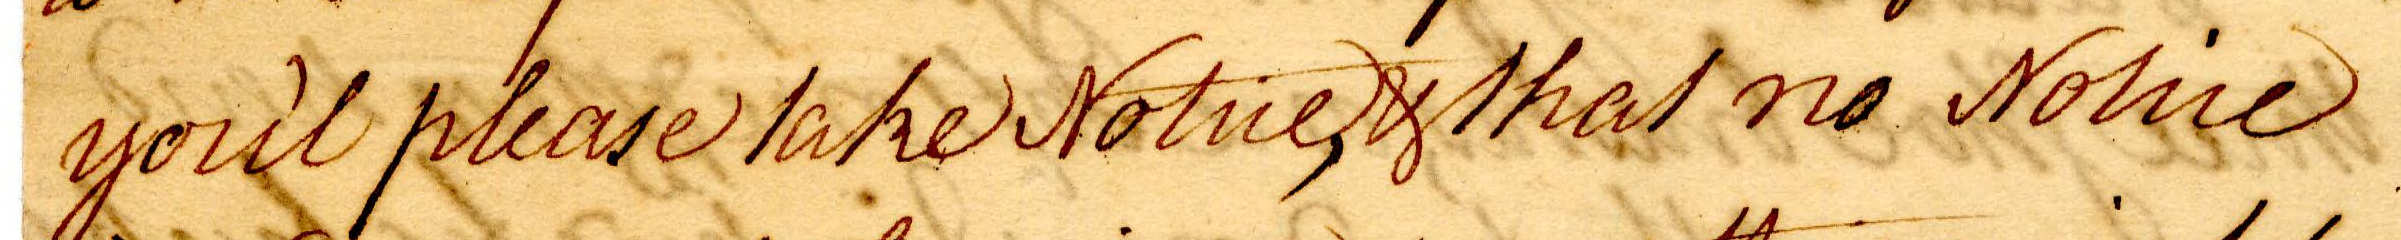you'l please take Notice, that no Notice
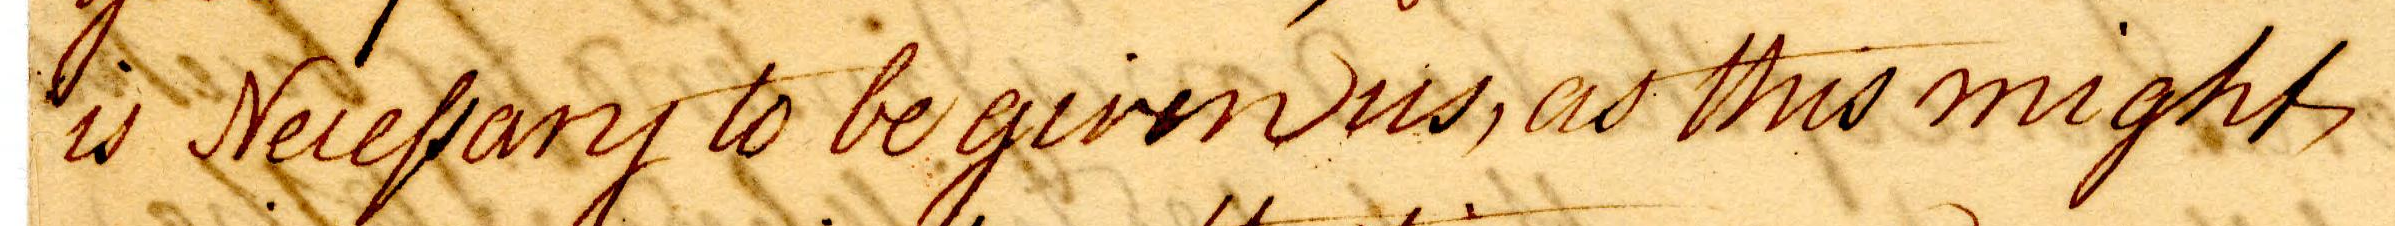is Necessary to be given us, as this might
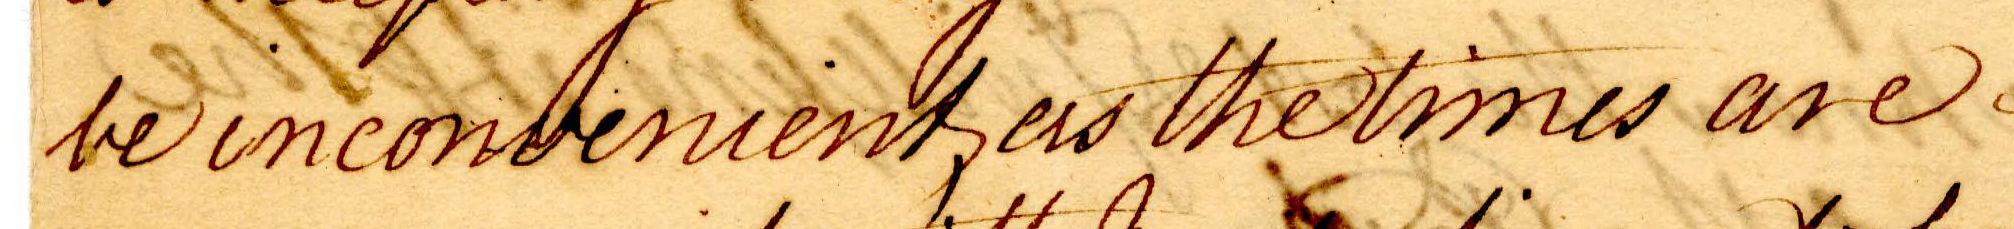be inconvenient, as the times are
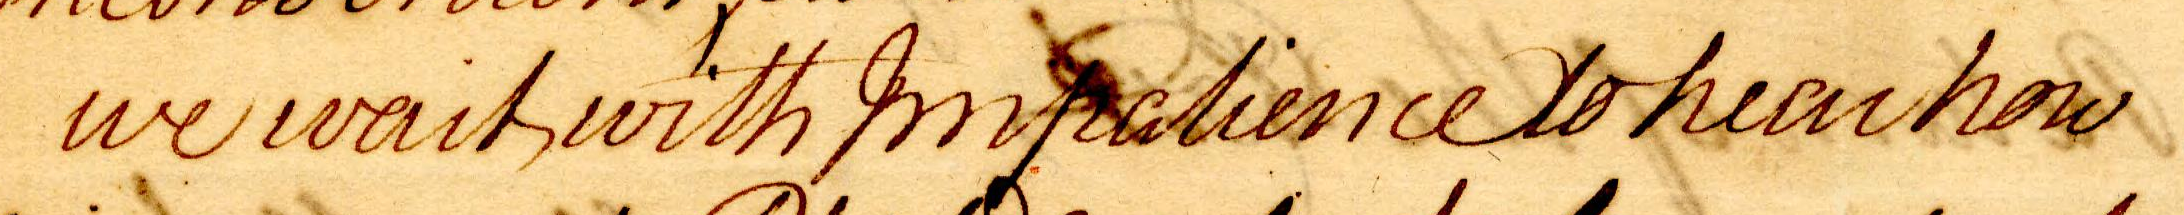we wait with Impatience to hear how
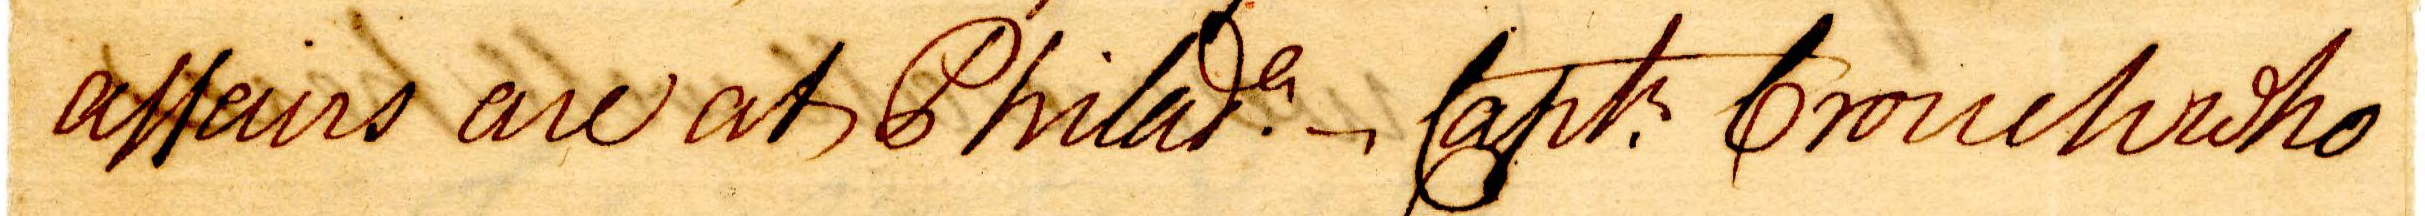affairs are at Philad^a- Capt. Crouch who
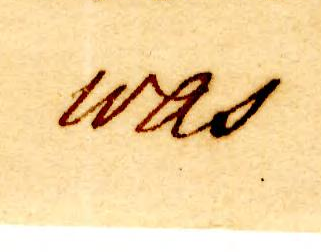was
